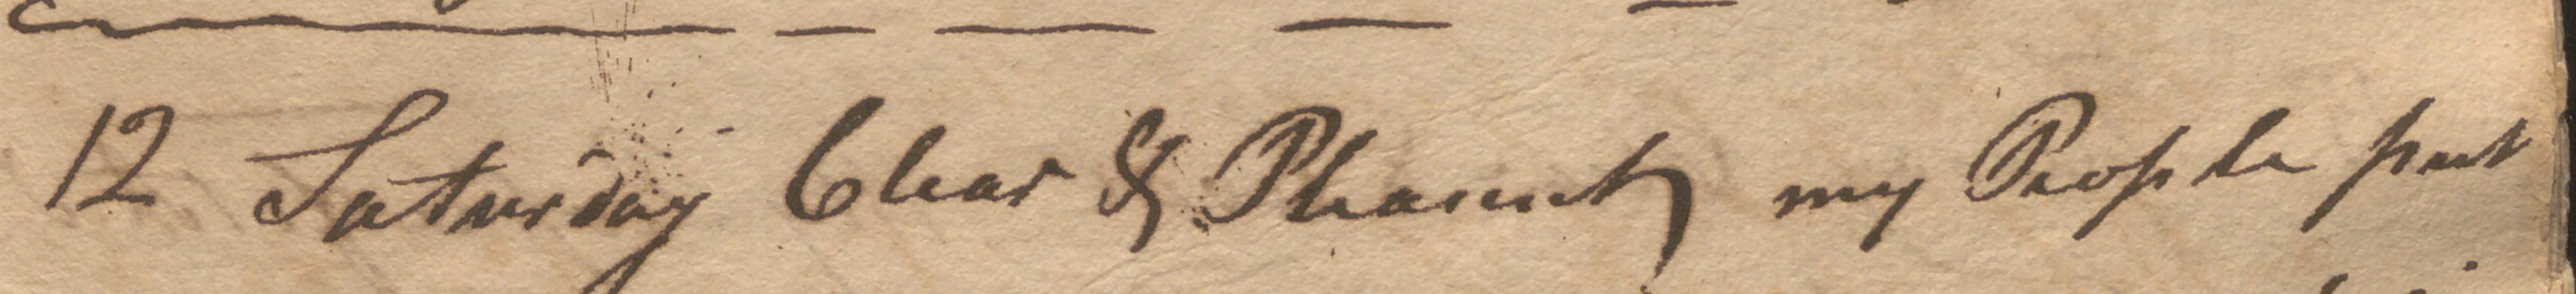12 Saturday Clear & Pleasent my People put
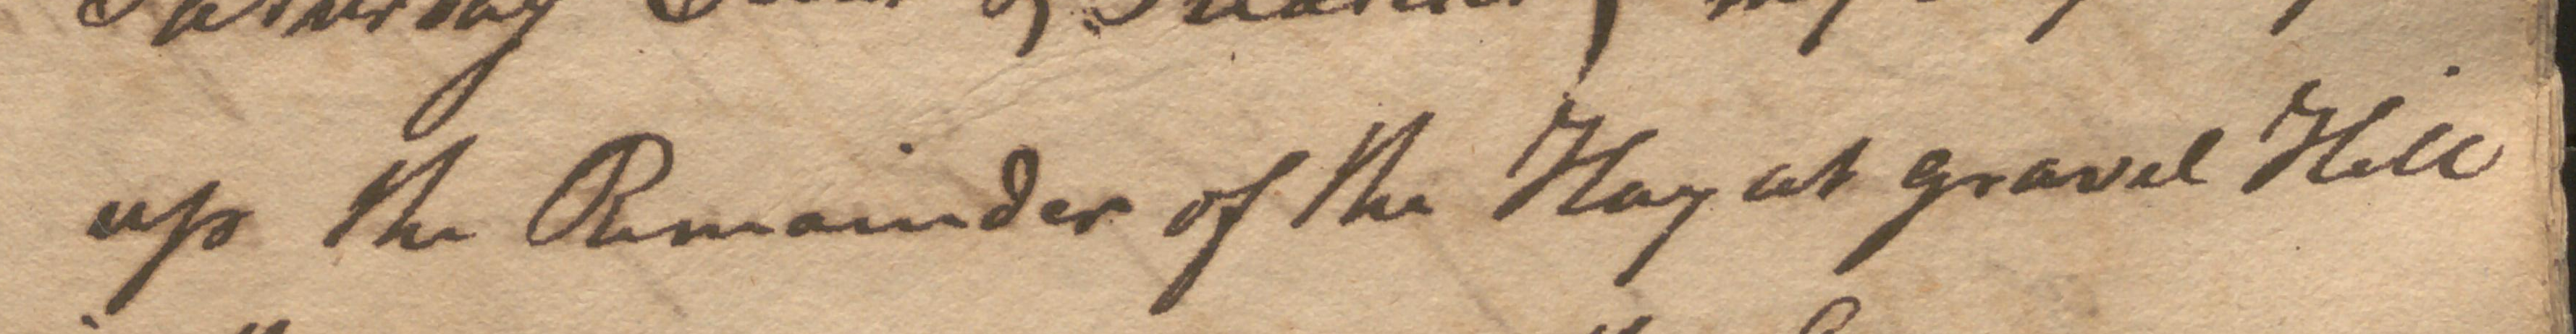up the Remainder of the Hay at gravel Hill
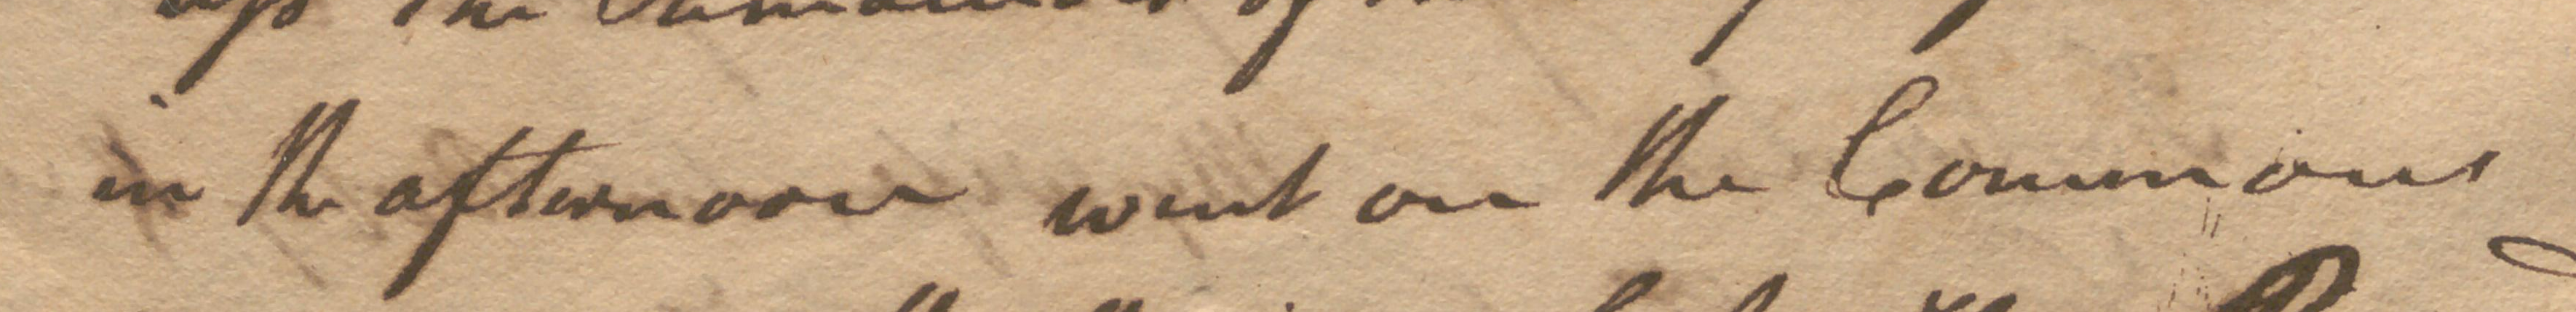in the afternoon went on the Commons
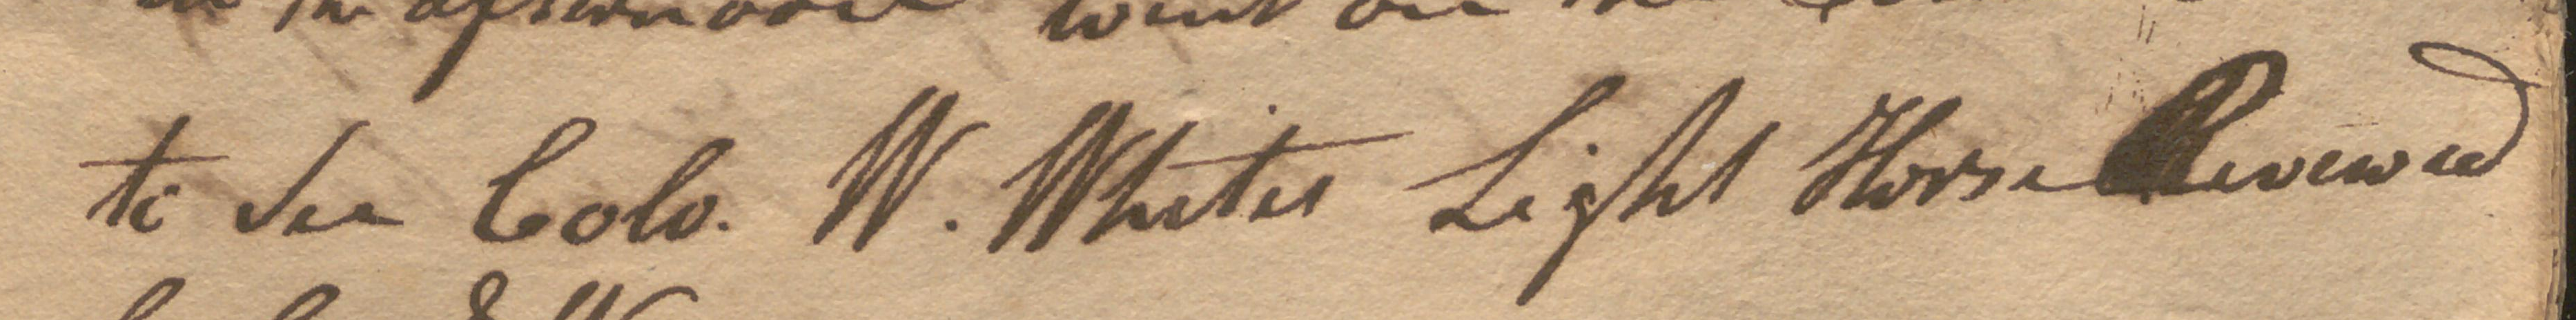to see Colo. W. Whites Light Horse Revewed
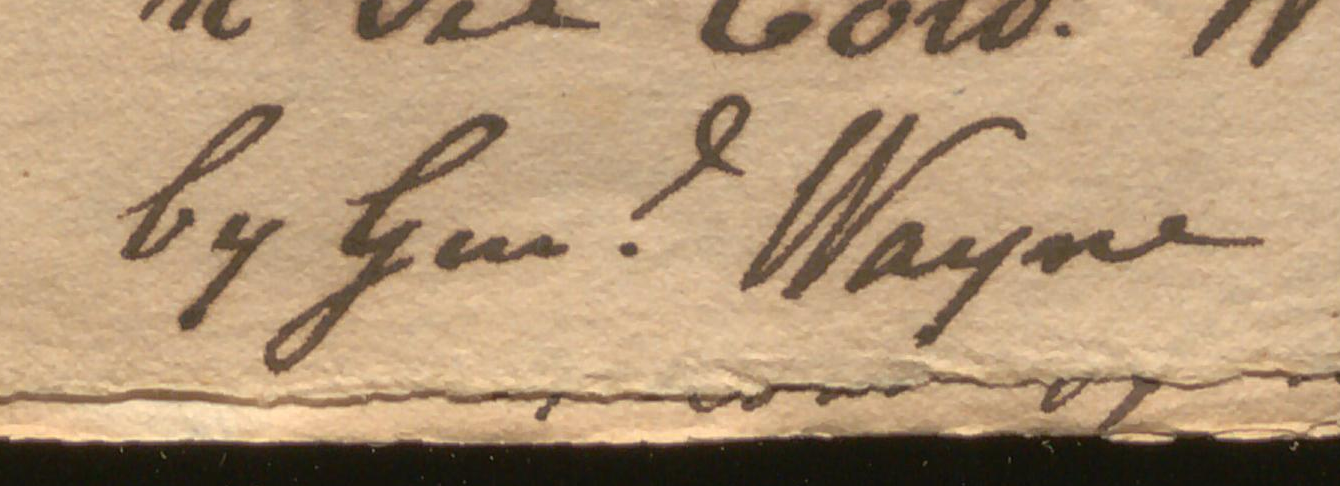by Gen^l. Wayne
